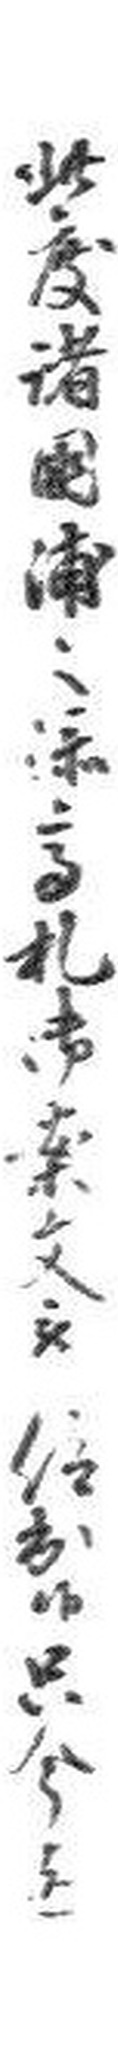此度諸国浦々添高札御案文被仰出候只今迄
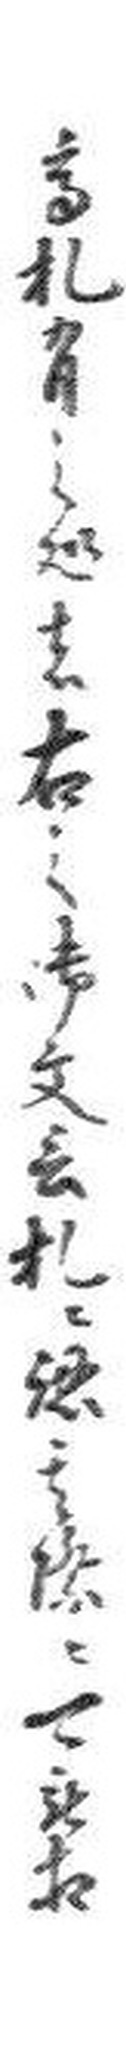高札有之処者右之御文言札ニ認其際ニ可被相
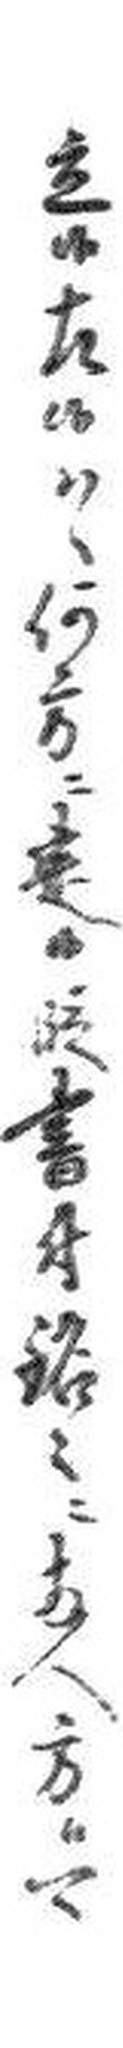立候左候ハゝ何方ニ建候段書付銘々ニ両人方江可
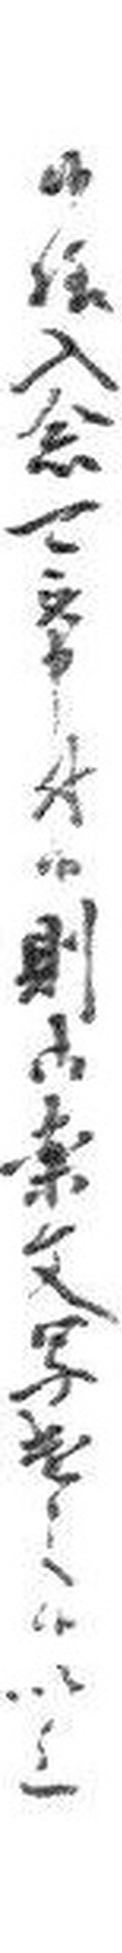候様入念可被申付候則御案文写遣之候以上
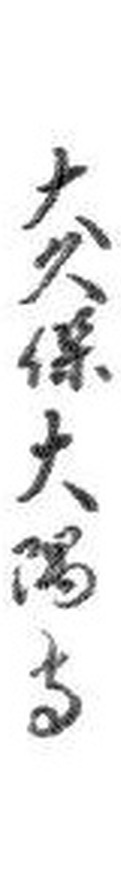大久保大隅守

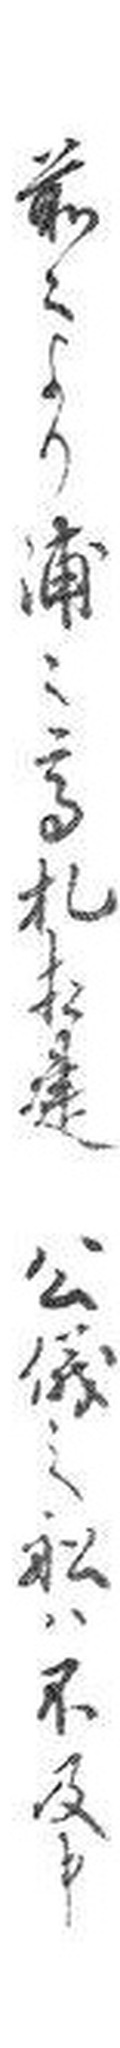前々より浦々高札相建公儀之船ハ不及申
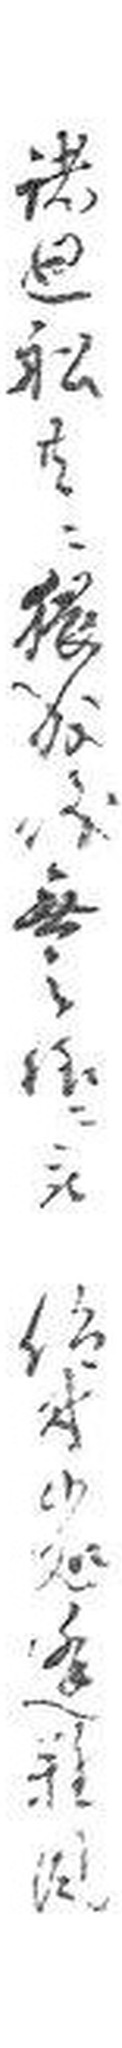諸廻船共ニ猥成儀無之様ニ被仰付候処逢難風
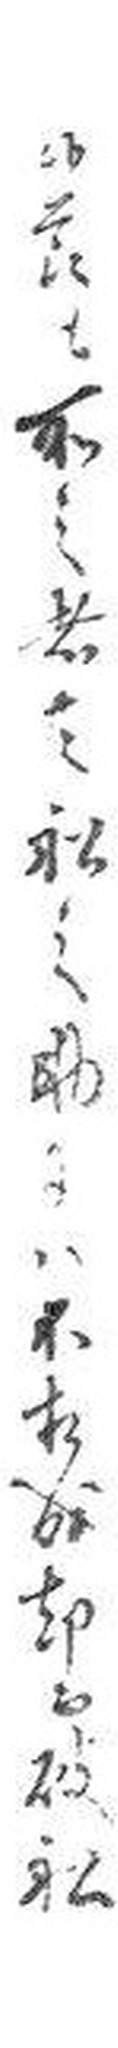候節も所之者共船之助にハ不相成却而破船
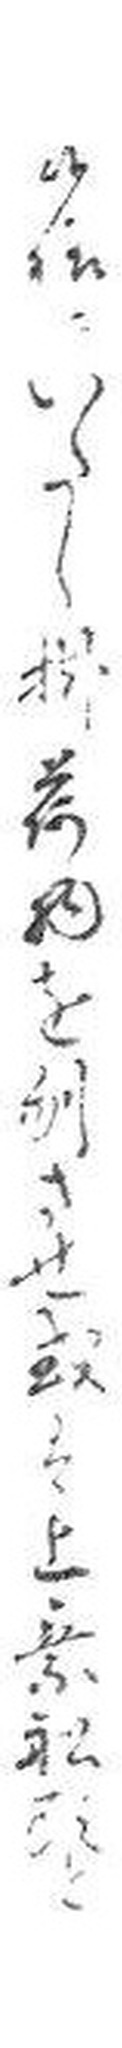候様ニいたし掛荷物を納させ或いは上乗船頭と
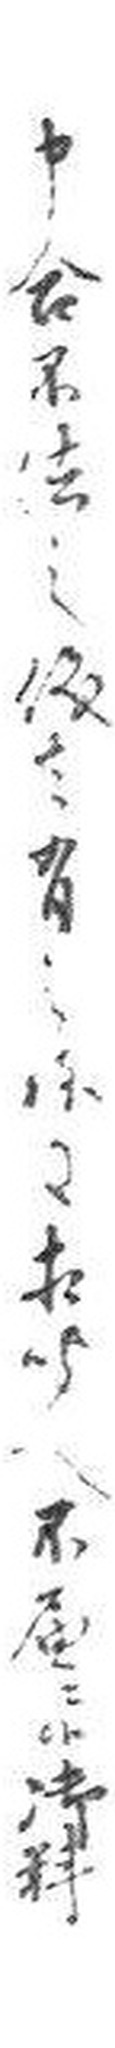申合不法之儀共有之様に相聞へ不届ニ候御料
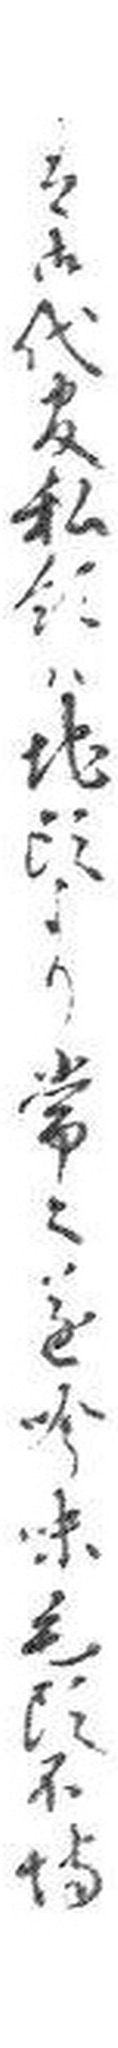は御代官私領ハ地頭より常々遂吟味毛頭不埒
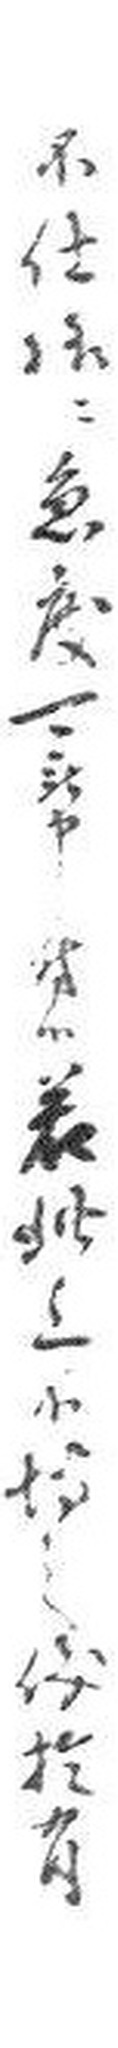不仕様ニ急度可被申付候若此上不埒之儀於有
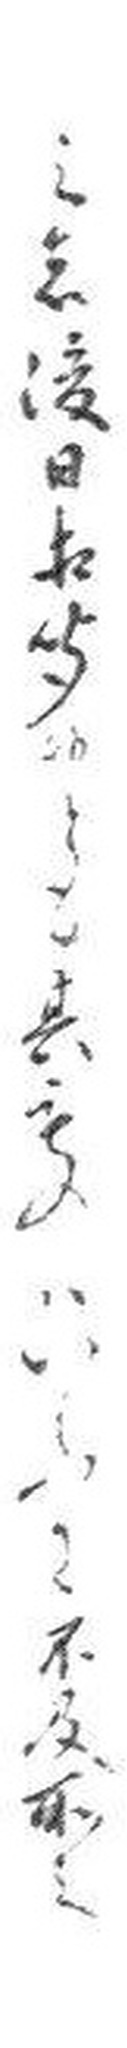之者後日相聞候とも其処ハいふに不及所之
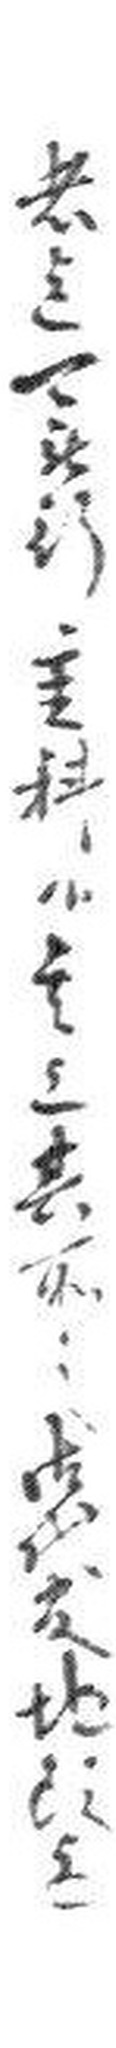物迄可被行重科候其上其所之御代官地頭迄
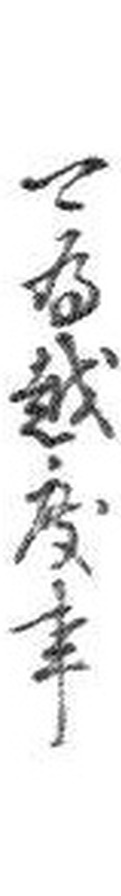可為越度事
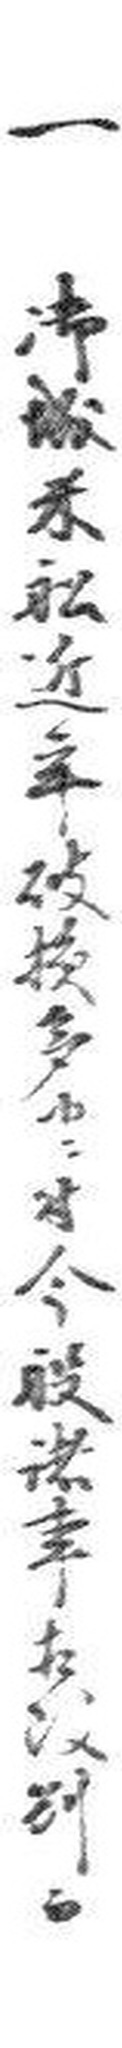一御城米船近年破損多候ニ付今般諸事相改別而
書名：家譜 二十九 吉邦公 従正徳二年到正徳三年
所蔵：福井県文書館 Fukui Prefectural Archives
